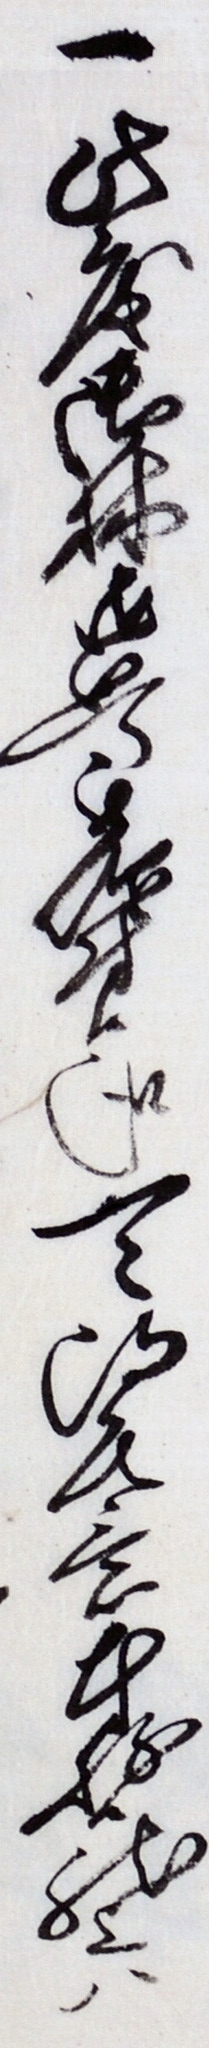一此度御林御廻り被仰付候趣一々得其意奉存候然上ハ
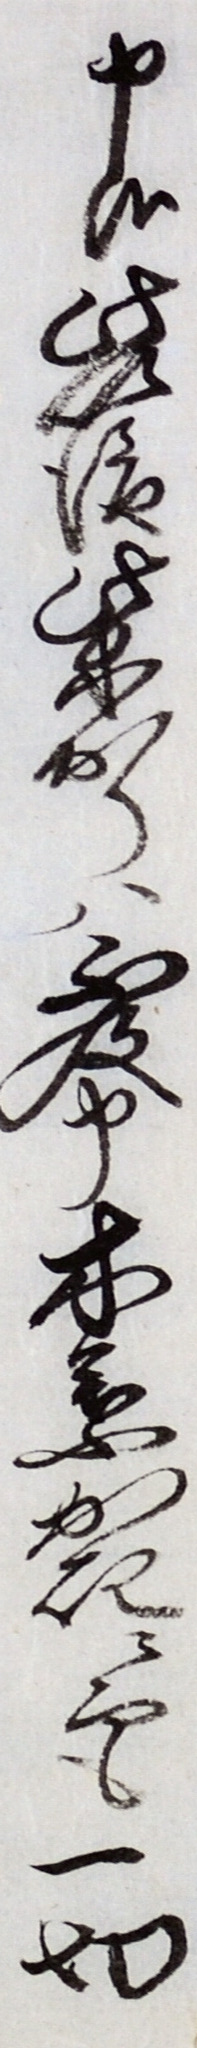申候此以後柴かりハ不及申木葉かきニ而も一切
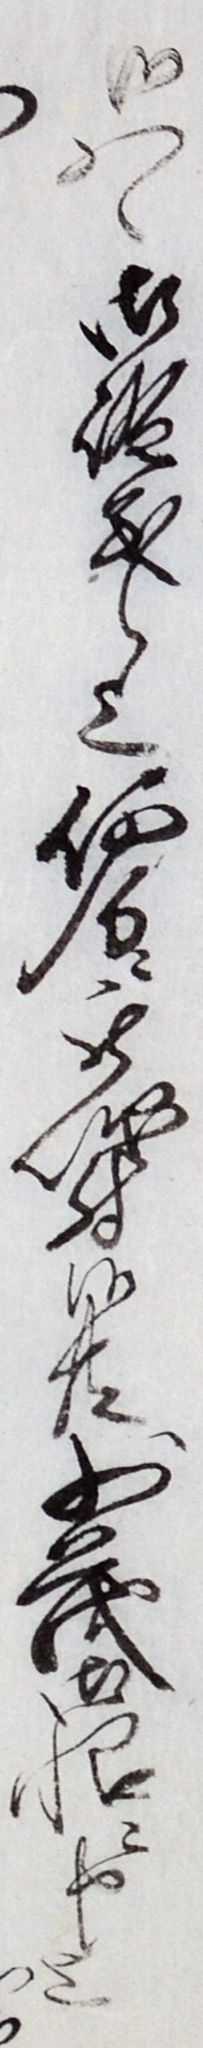候ハヽ御詮義之上何分ニ被仰付候共少も御恨ニ申上間
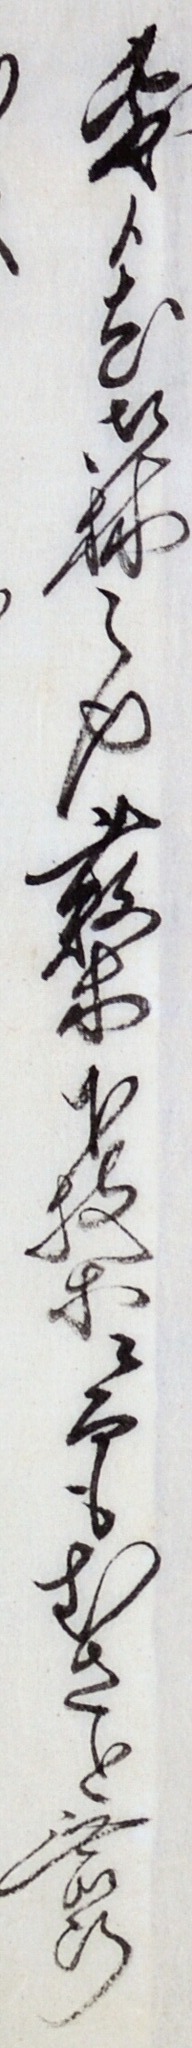敷候尤御林之内薮木下枝等ニ而もむさと無御断
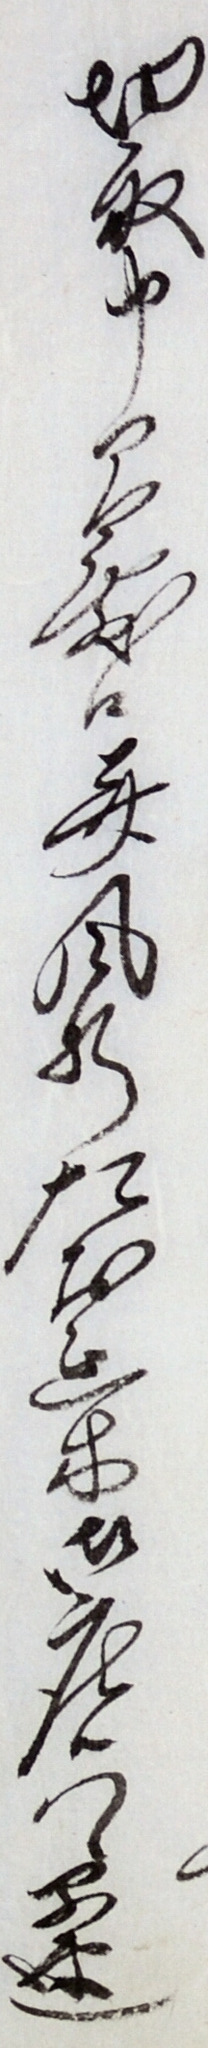切取申間敷候并風折たおれ木御座候ハヽ早速

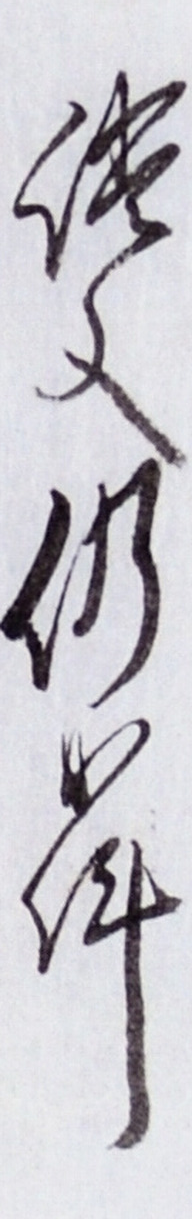証文仍如件
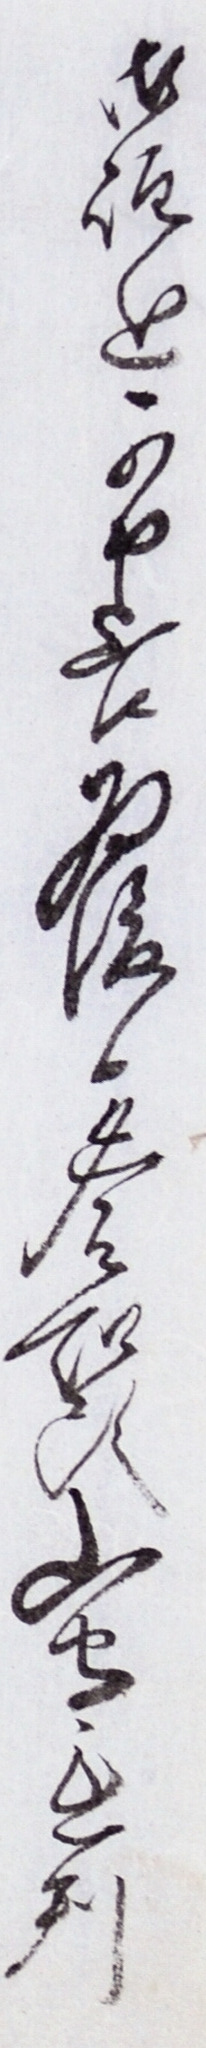御註進可申上候為後日名主組頭山守連判
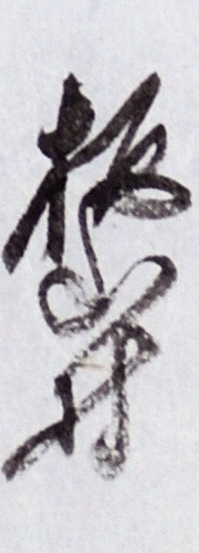板山村
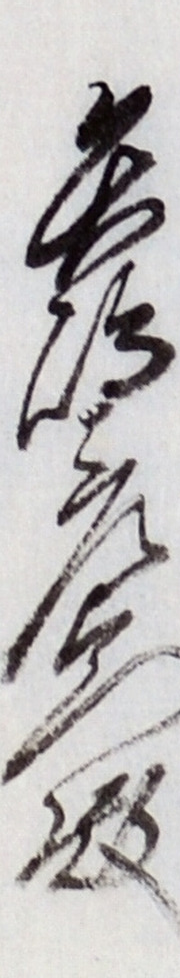矢嶋庄右衛門殿
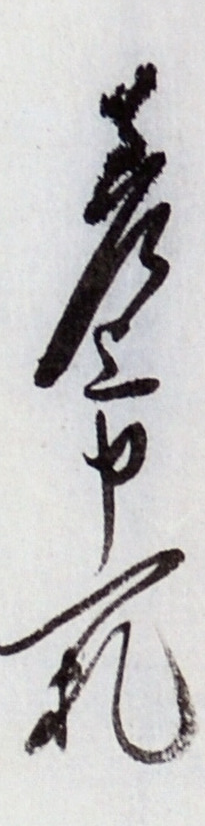差上申一札
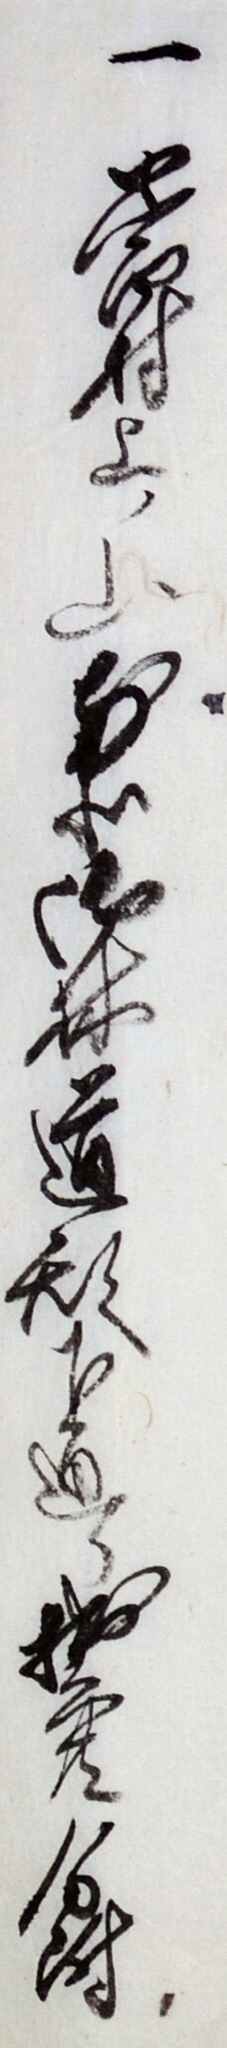一当村上ノ山南北御林道形下通り拙者共分附

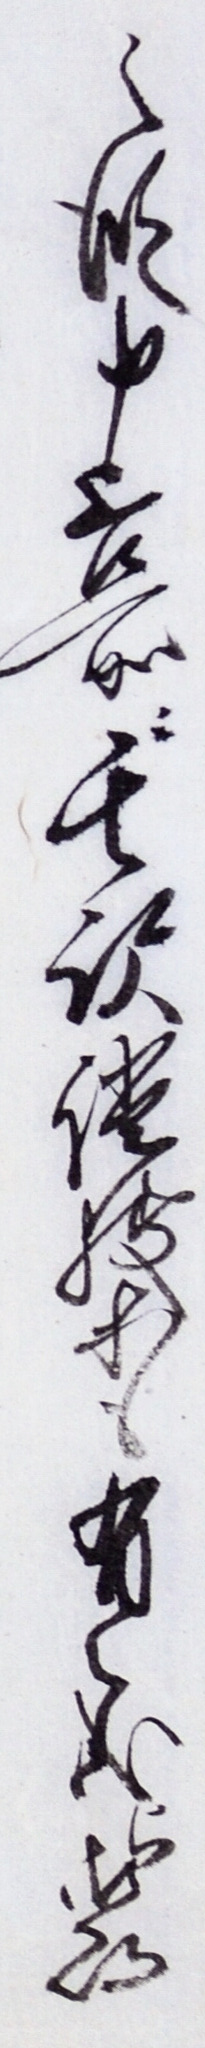之段申上候所ニ其訳証拠等も有之哉与御尋
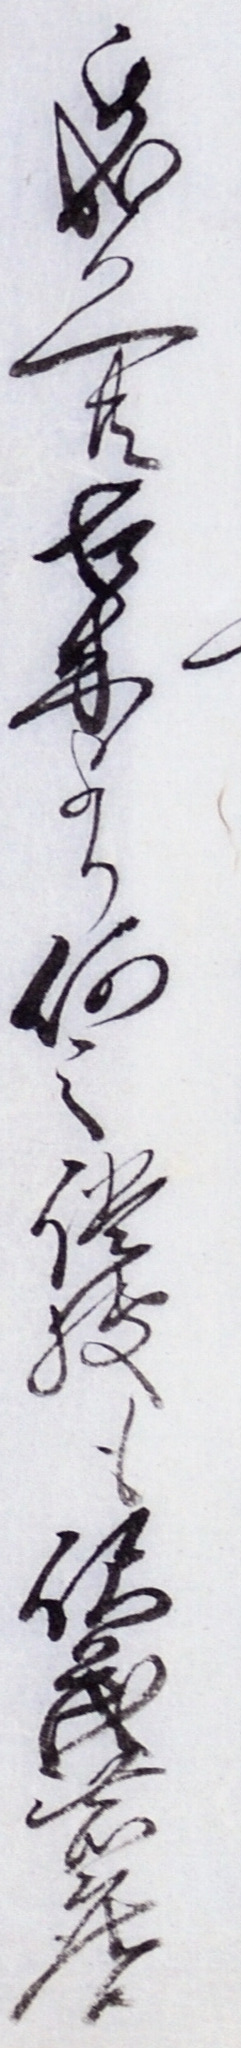被成候へ共古来より何之証拠も訳も無御座候
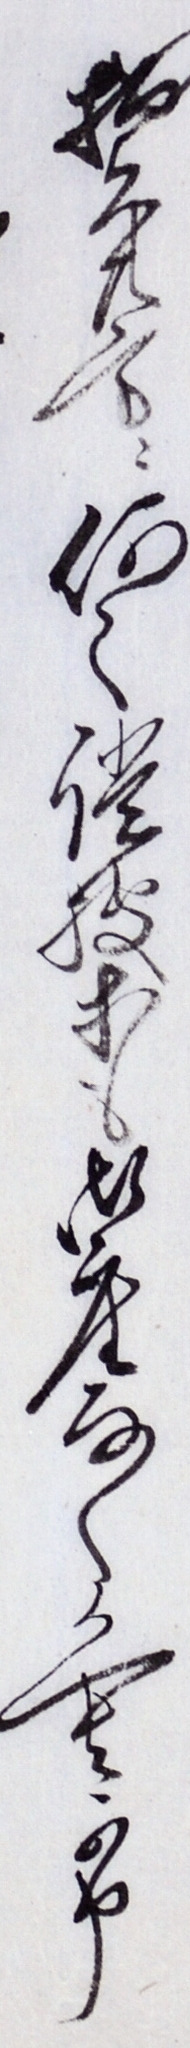拙者共方ニ何之証拠等も御座なく候へは可申
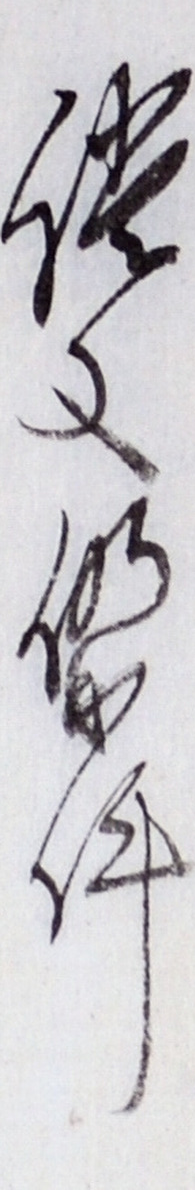証文仍如件
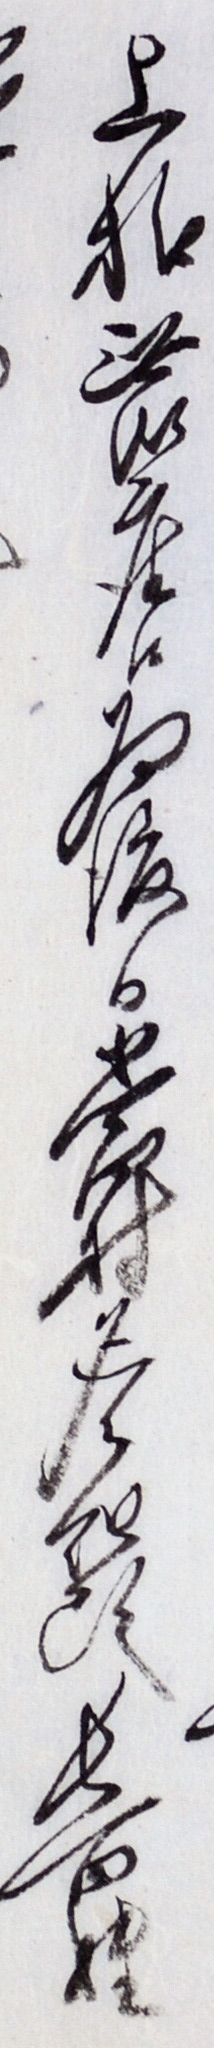上様無御座候為後日当村名主組頭長百姓
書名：御林御竹藪証文控
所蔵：伊那市立高遠町図書館・合同会社AMANE
